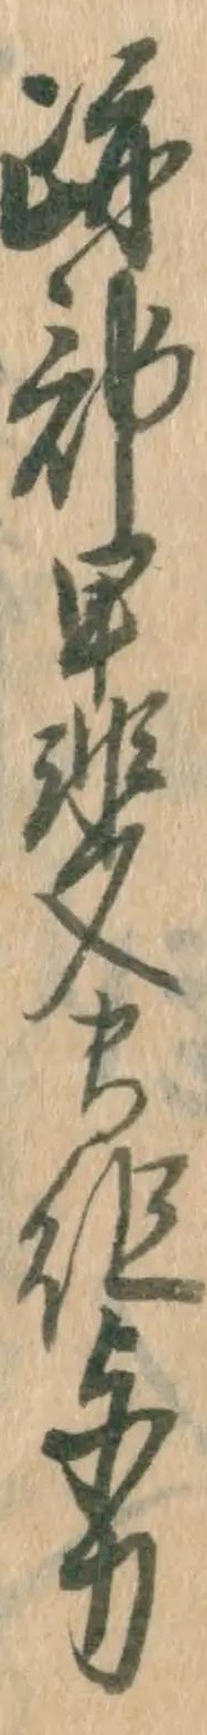跡部甲斐守組与力

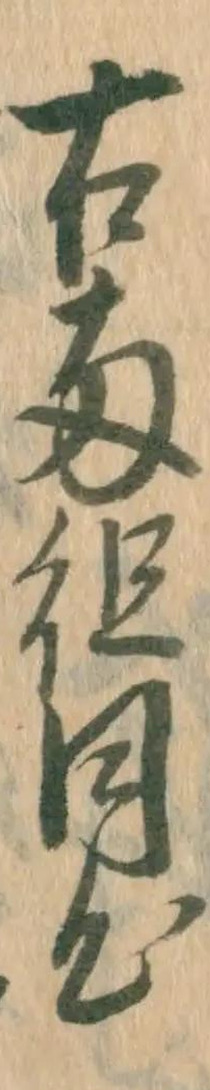右両組同心
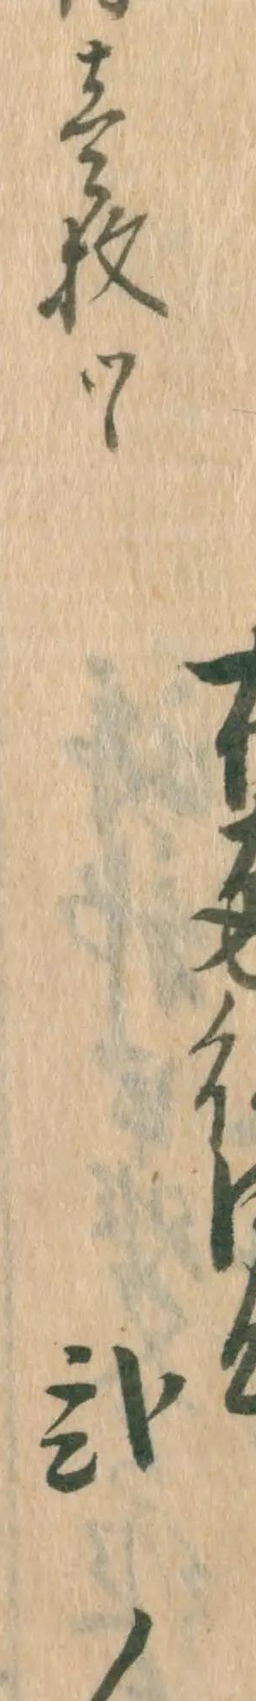同壱枚ツヽ弐人
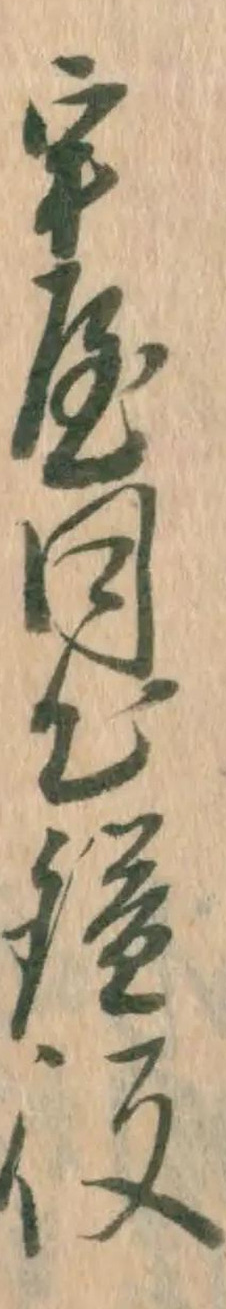牢屋同心鎰役
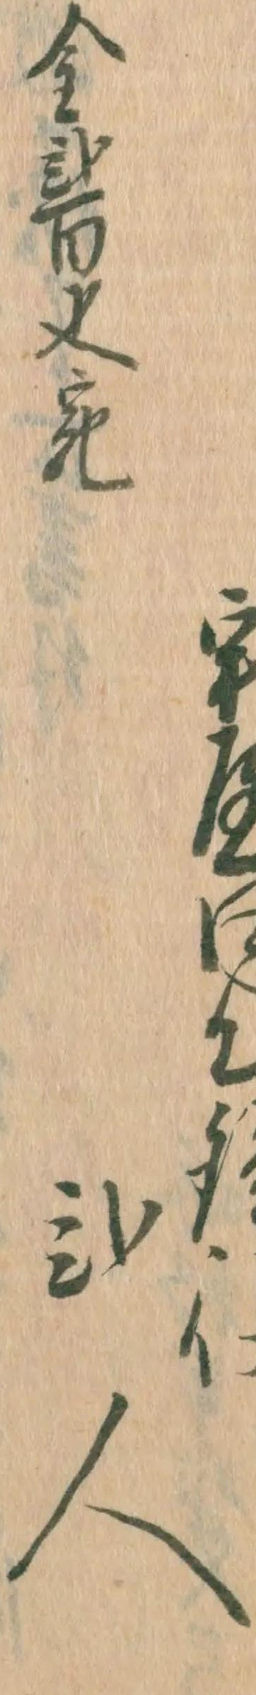金弐百疋宛弐人
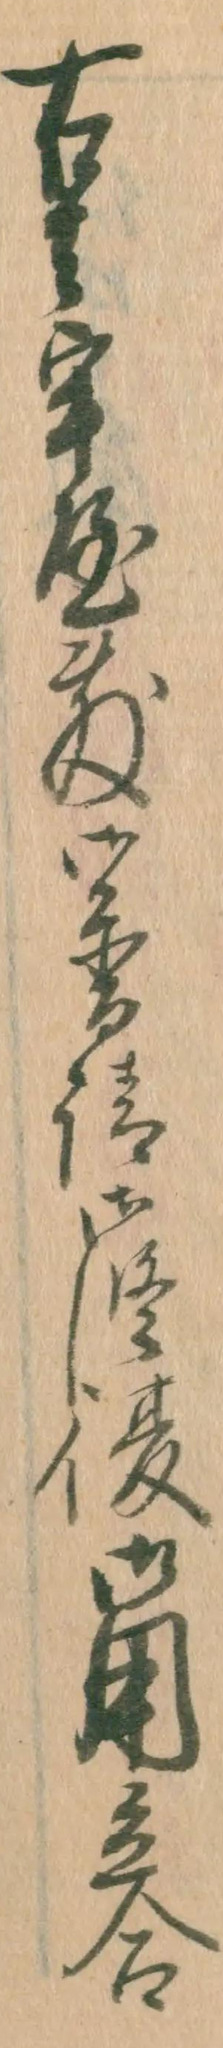右は牢屋敷御普請御修復御用立合
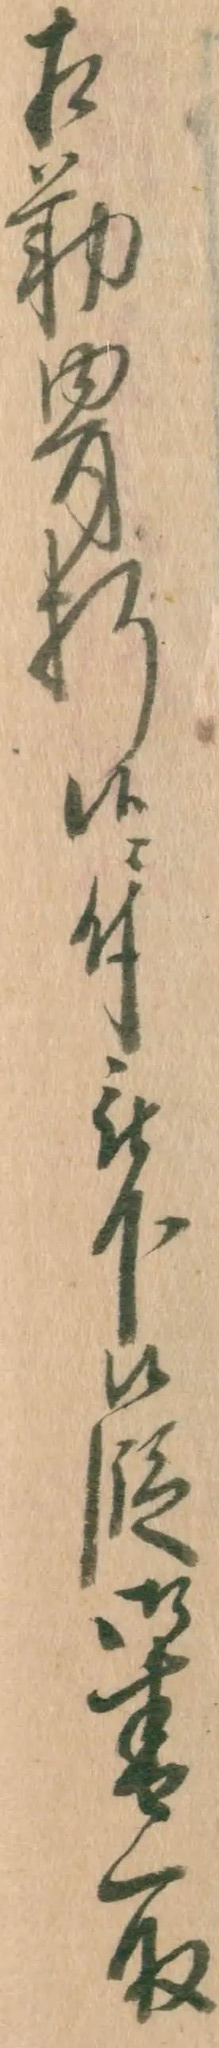相勤骨折候ニ付被下候段御来所
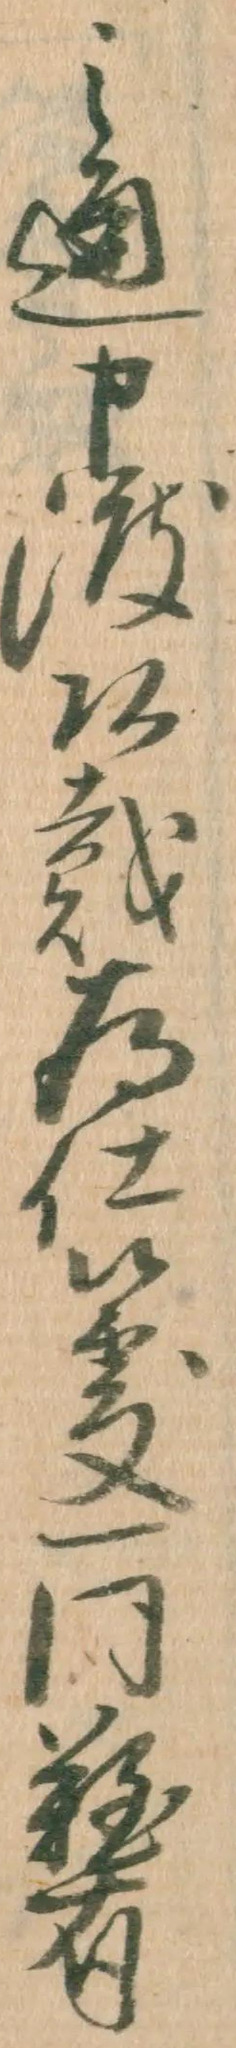之通申渡頂戴為仕候処一同難有
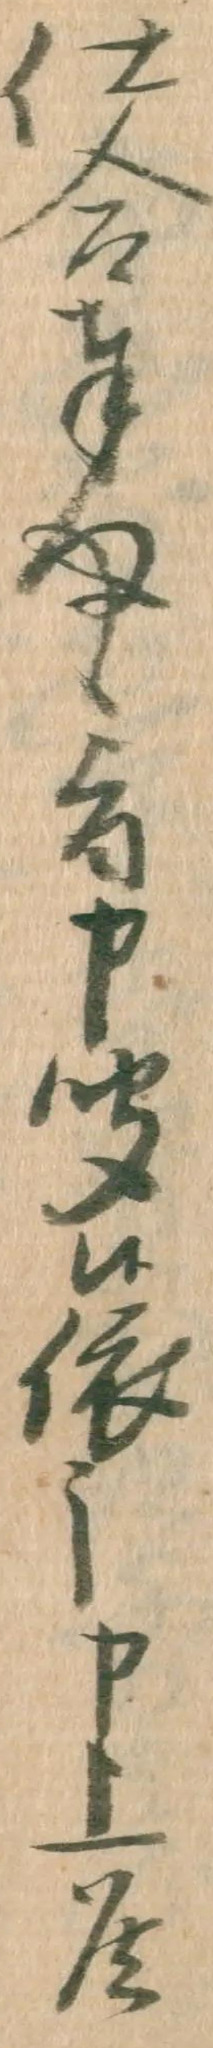仕合奉存候旨申聞候依之申上候
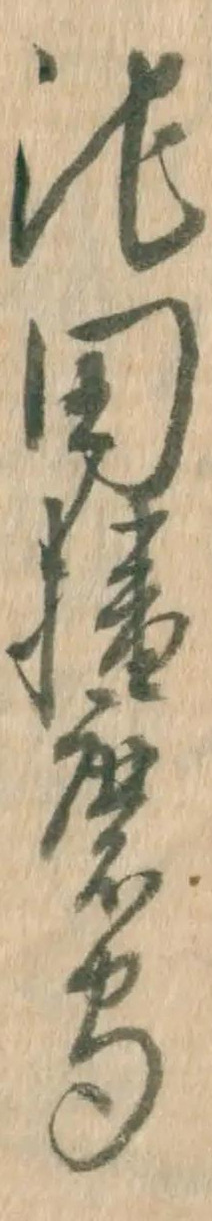池田播磨守

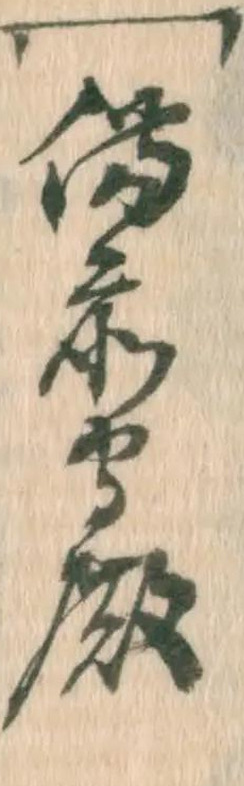│[備前守殿
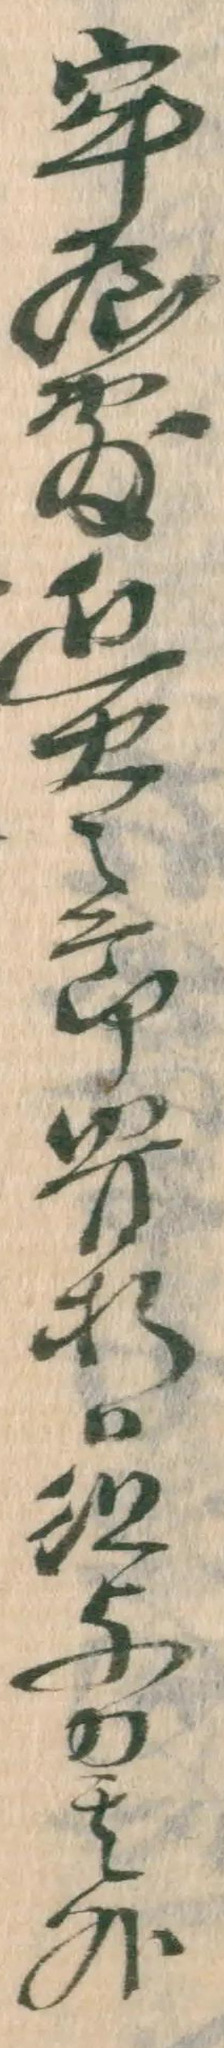│牢屋敷近火之節骨折候組与力其外
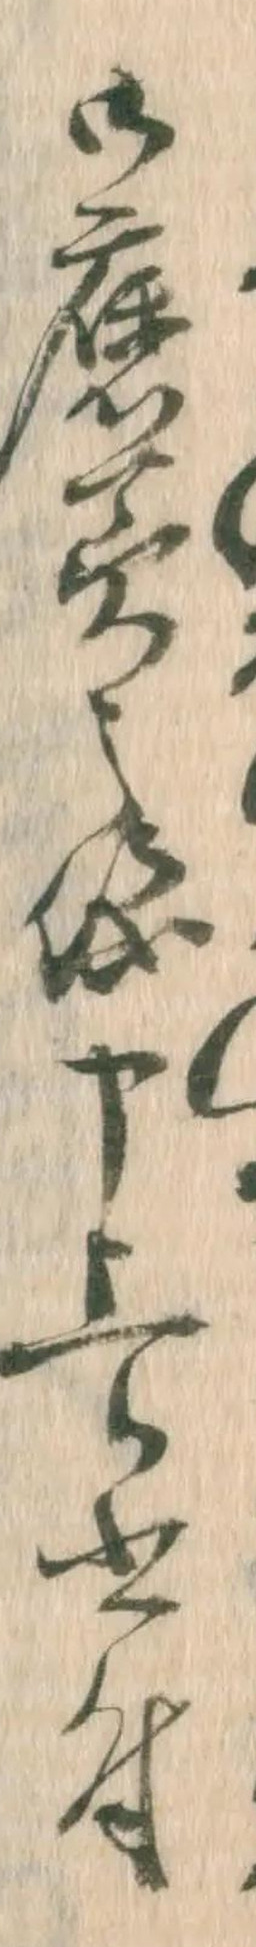│御褒美之儀申上候書付
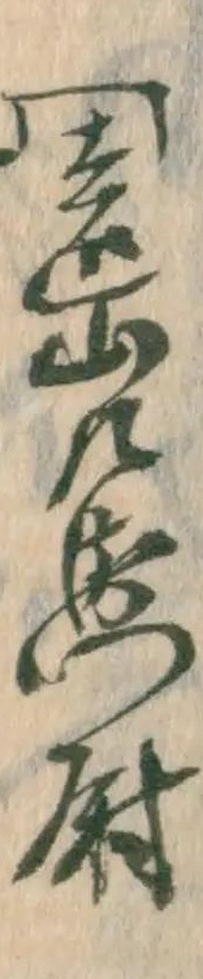│[遠山左衛門尉
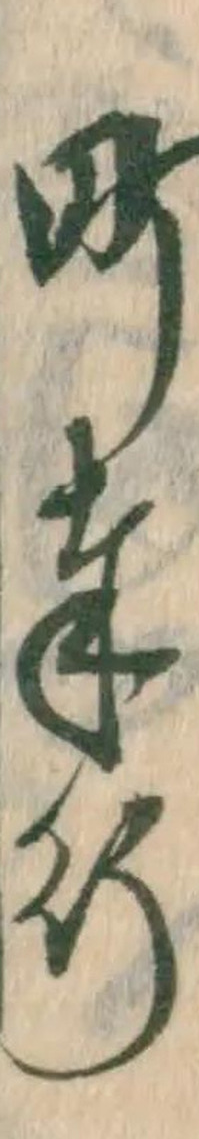│町奉行
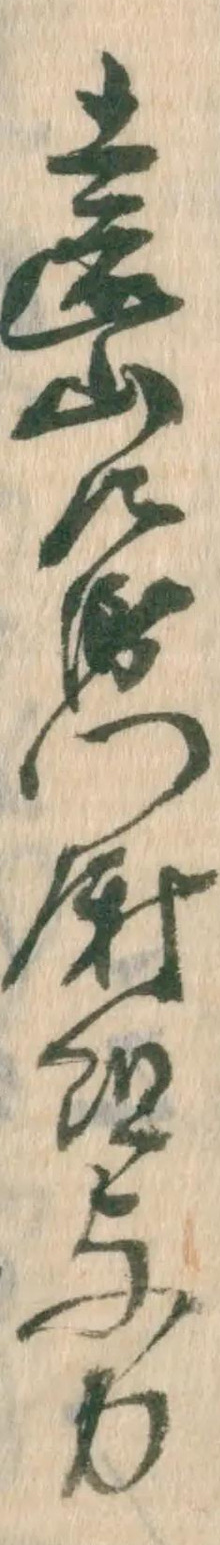遠山左衛門尉組与力
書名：七十冊物類集 71巻. [44] 四十三 牢屋敷御普請御修覆地震ニ付骨折候牢屋掛御褒美之部
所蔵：国立国会図書館 National Diet Library, JAPAN
